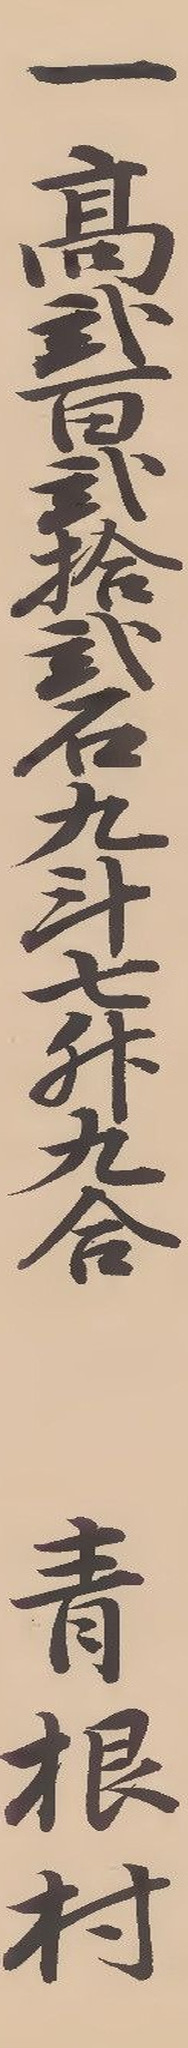一高弐百弐拾弐石九斗七升九合青根村
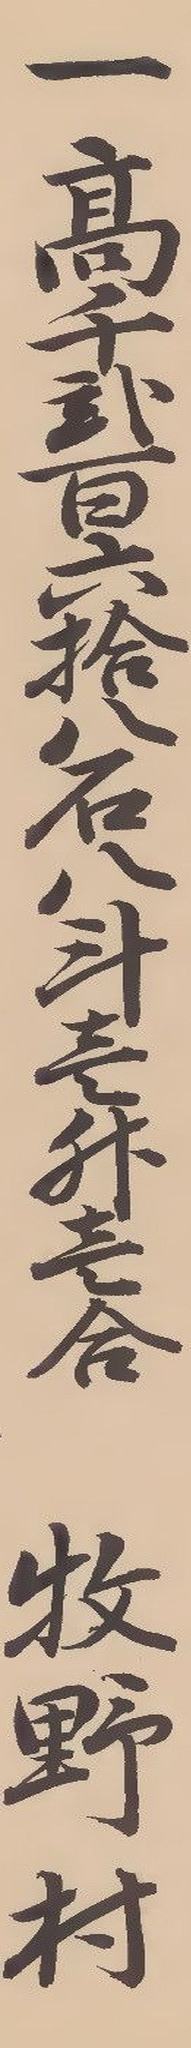一高千弐百六拾八石八斗壱升壱合牧野村
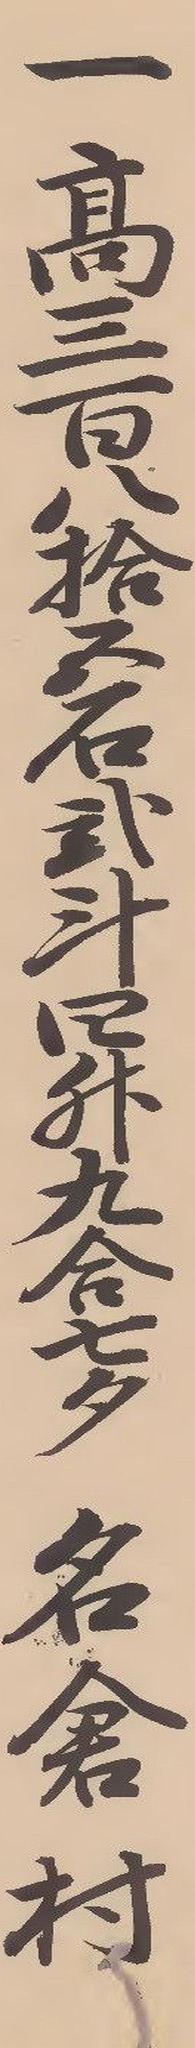一高三百八拾五石弐斗四升九合七勺名倉村
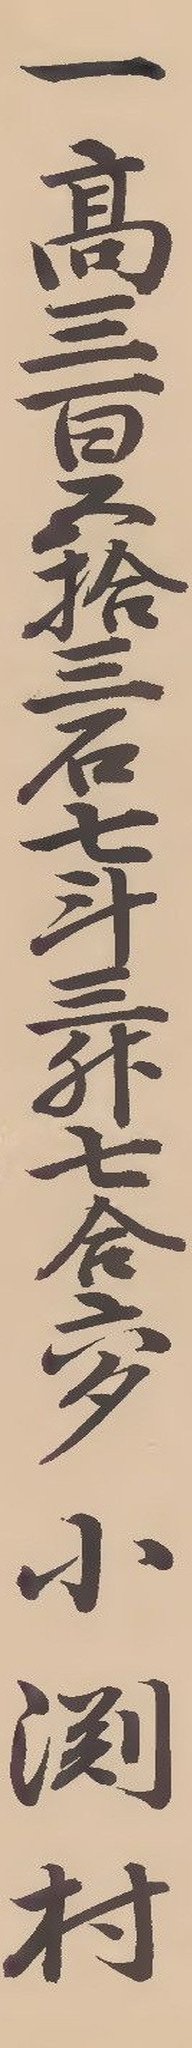一高三百五拾三石七斗三升七合六勺小渕村

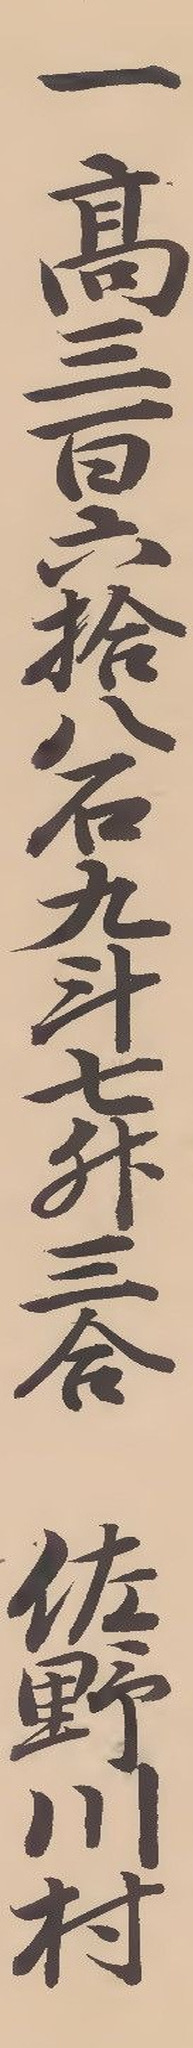一高三百六拾八石九斗七升三合佐野川村
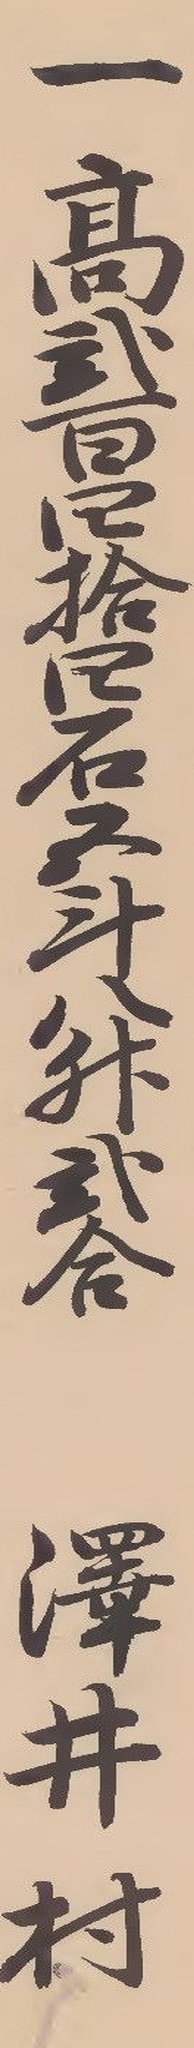一高弐百四拾四石五斗八升弐合澤井村
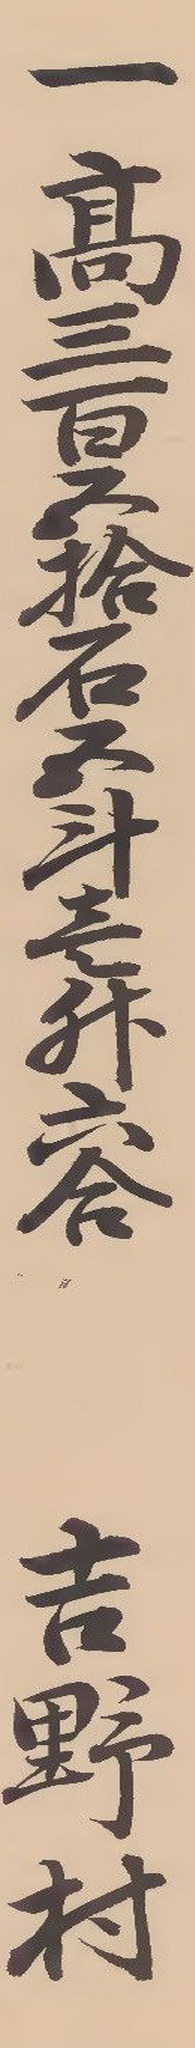一高三百五拾石五斗壱升六合吉野村
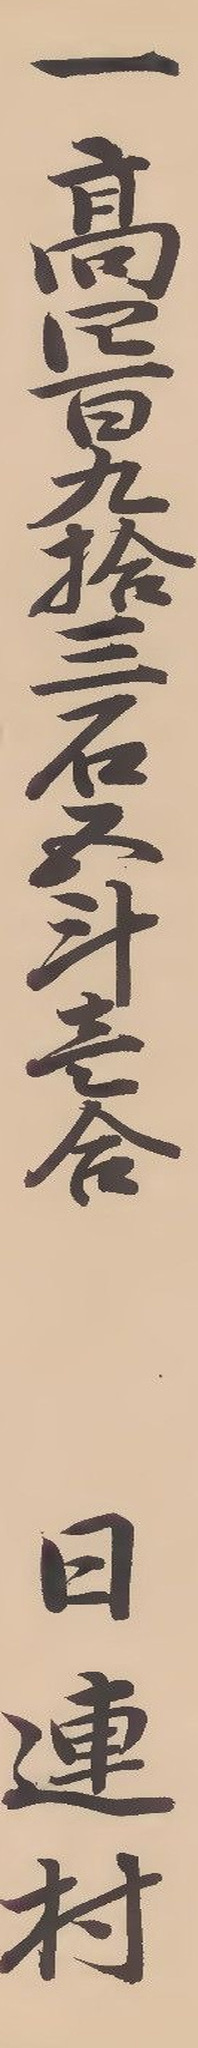一高四百九拾三石五斗壱合日連村
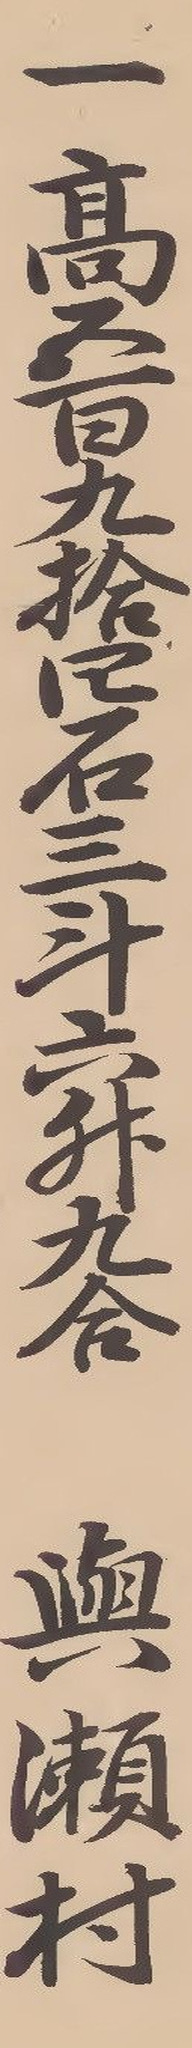一高五百九拾四石三斗六升九合与瀬村
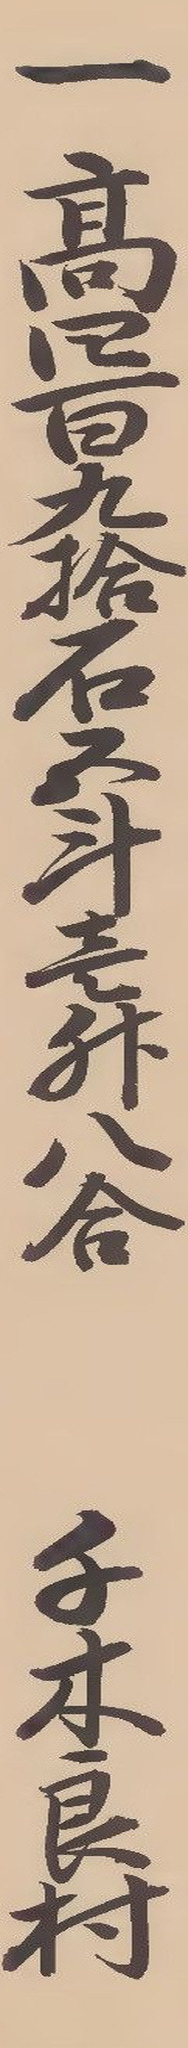一高四百九拾石五斗壱升八合千木良村
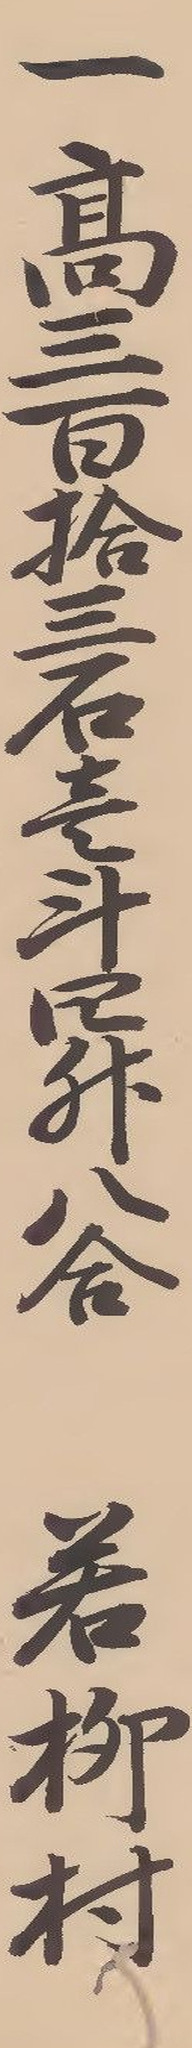一高三百拾三石壱斗四升八合若柳村
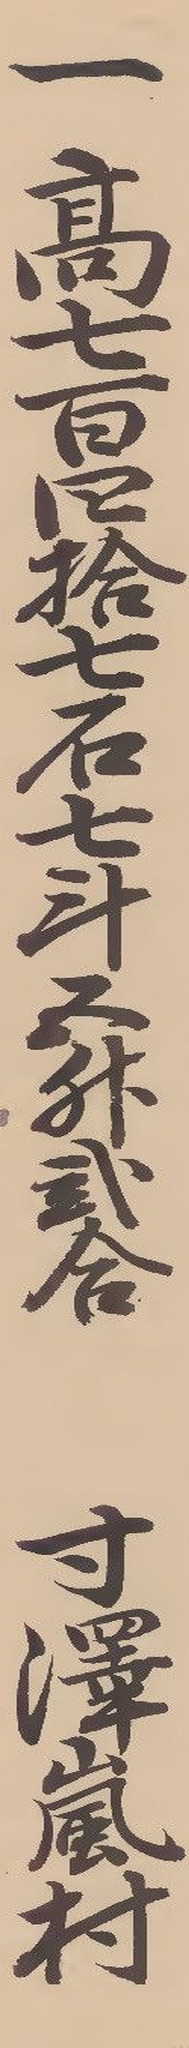一高七百四拾七石七斗五升弐合寸澤嵐村

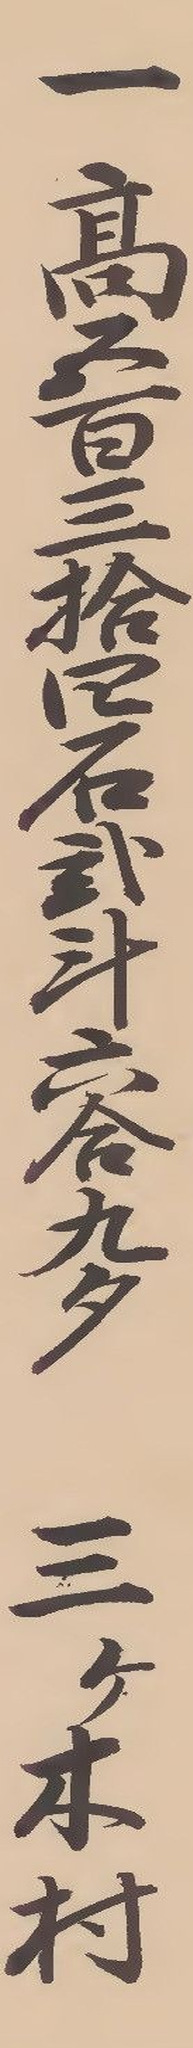一高五百三拾四石弐斗六合九勺三ヶ木村
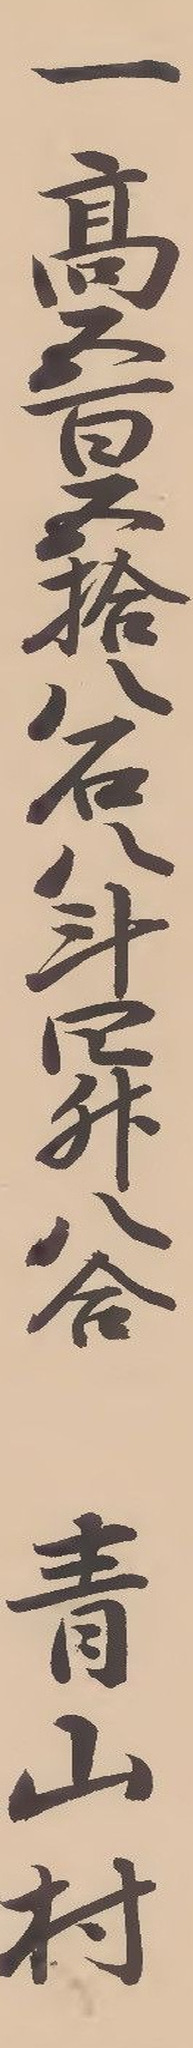一高五百五拾八石八斗四升八合青山村
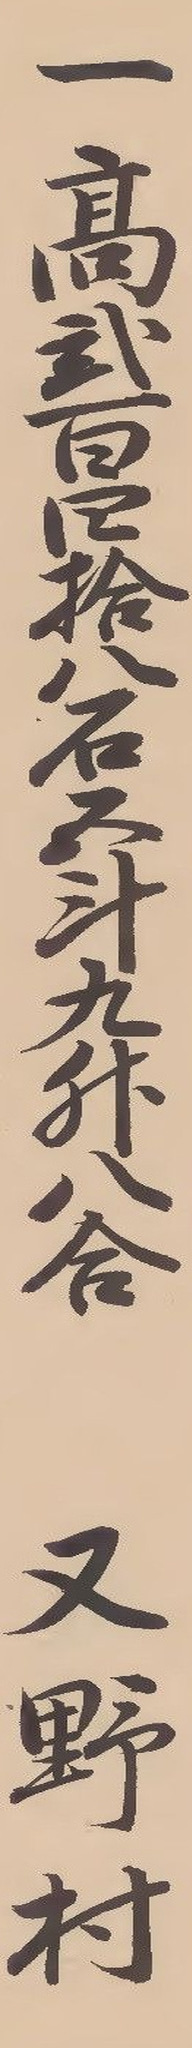一高弐百四拾八石五斗九升八合又野村
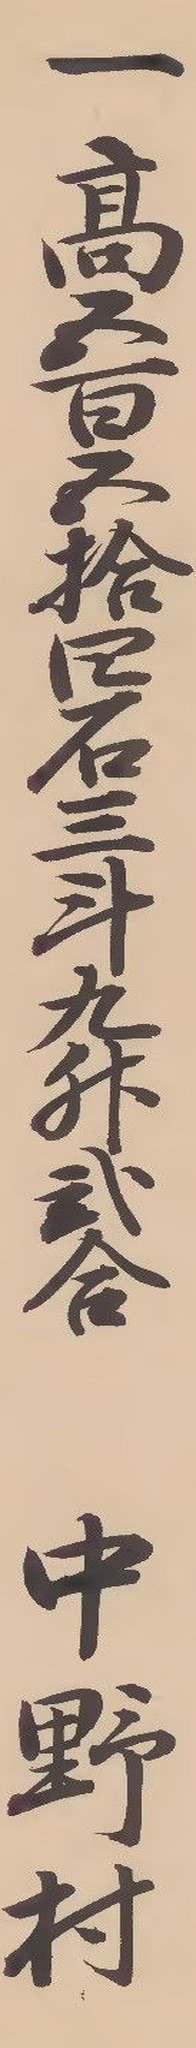一高五百五拾四石三斗九升弐合中野村
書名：相模国郷帳
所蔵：国立公文書館 National Archives of Japan
